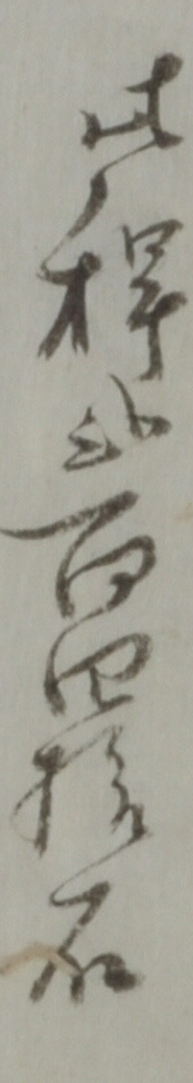此稈弐百四拾石
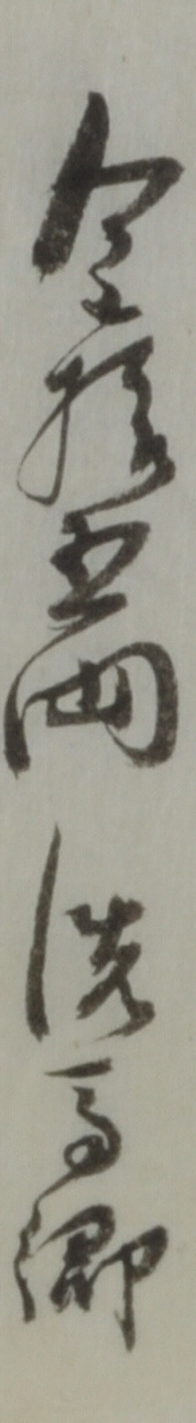金拾五両洗馬郷
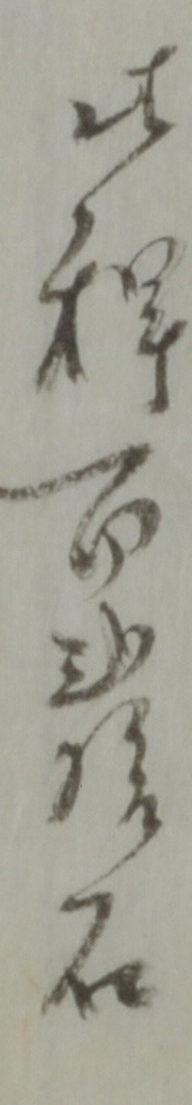此稈百弐拾石
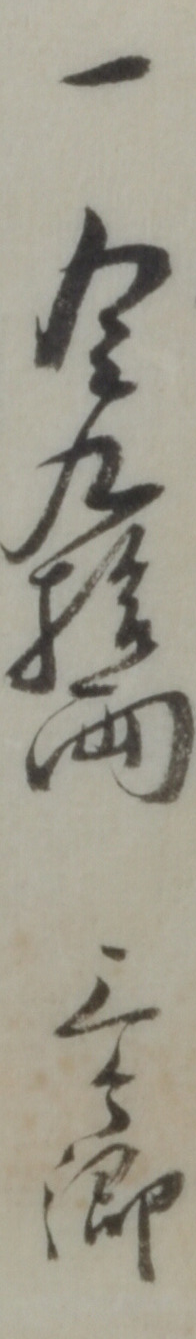一金九拾両三ヶ郷
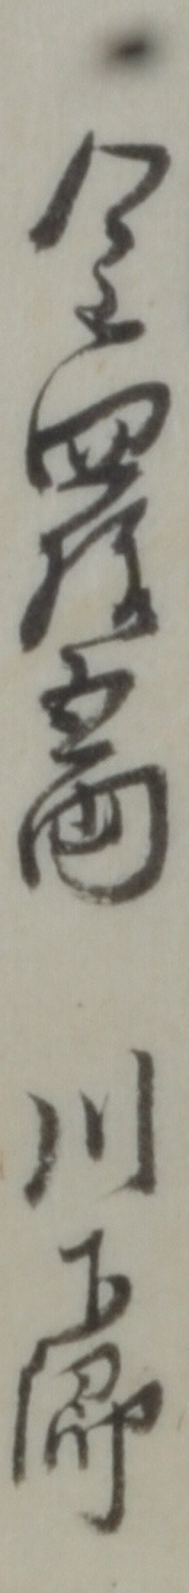金四拾五両中沢郷
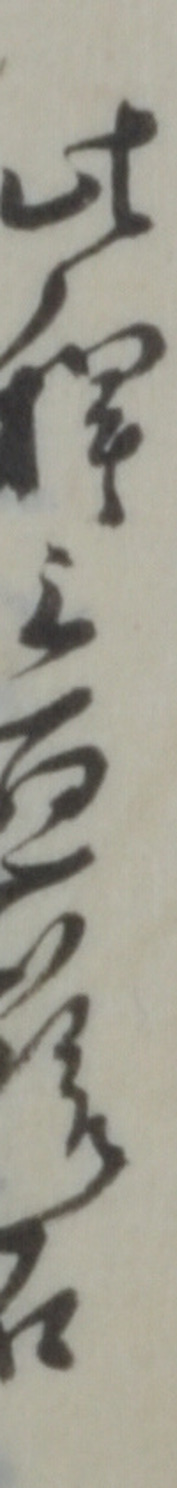此稈三百六拾石

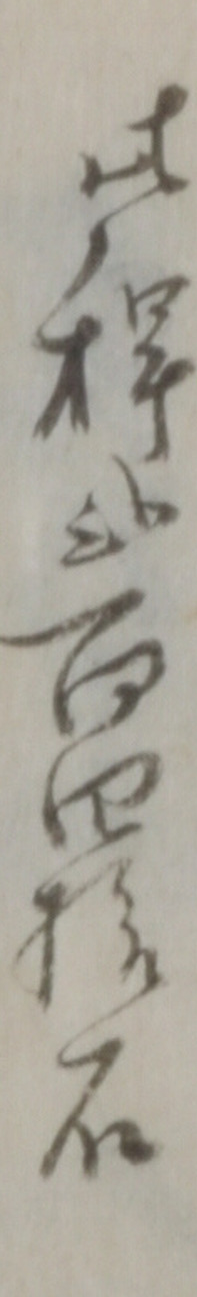此稈弐百四拾石
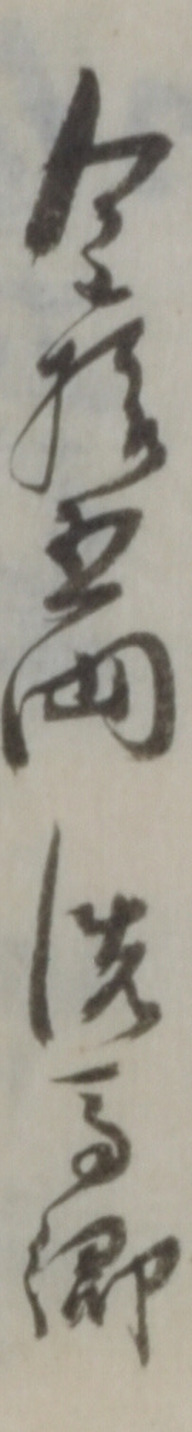金弐拾六両洗馬郷
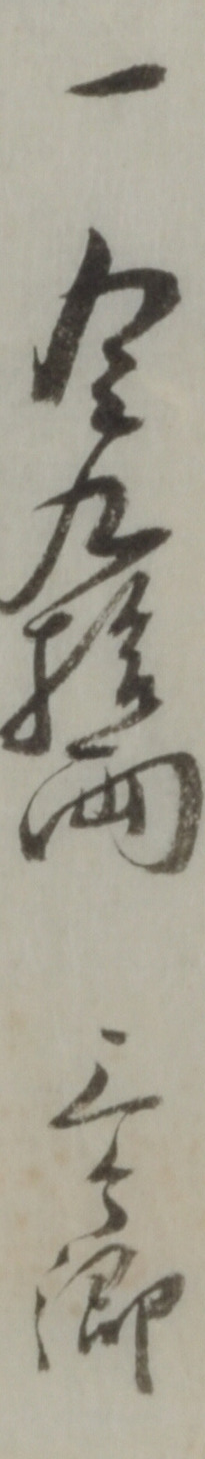一金九拾両三ヶ郷
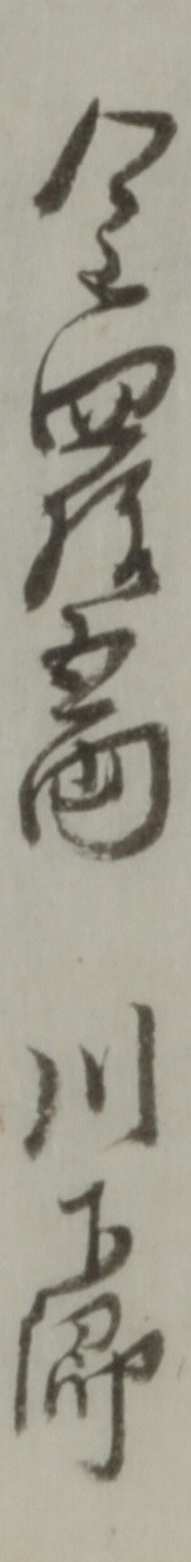金四拾五両川下郷
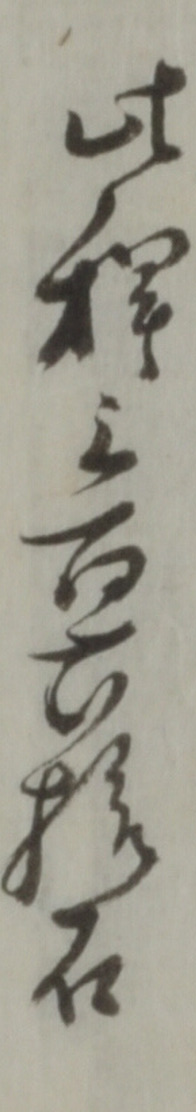此稈三百六拾石
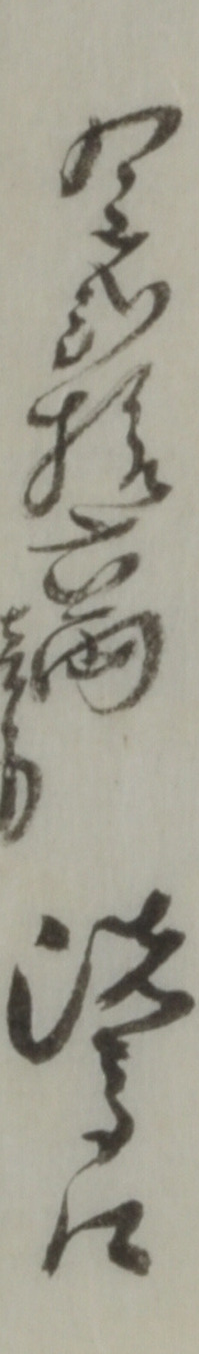金弐拾六両洗馬郷
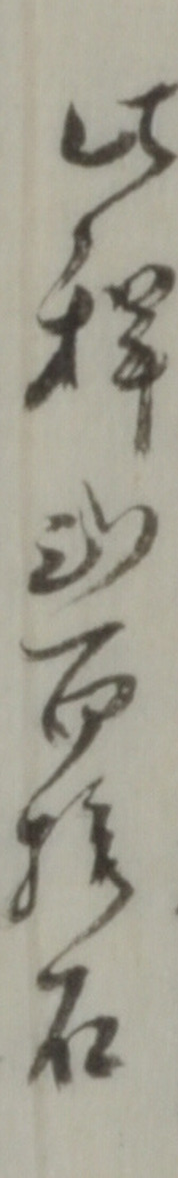此稈弐百拾石
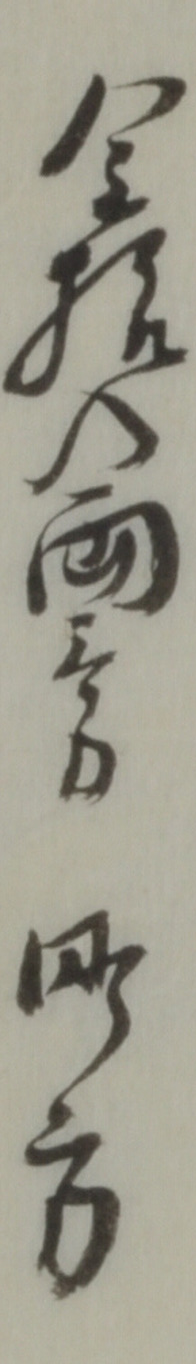金拾八両三分町方
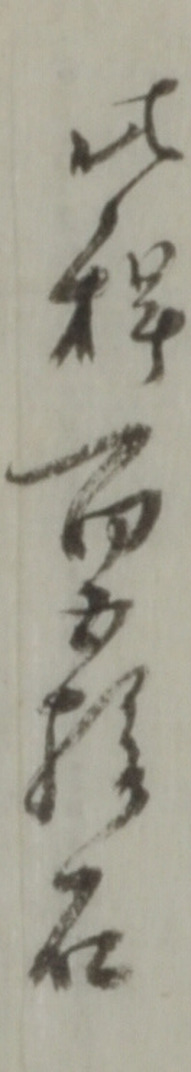此稈百五拾石
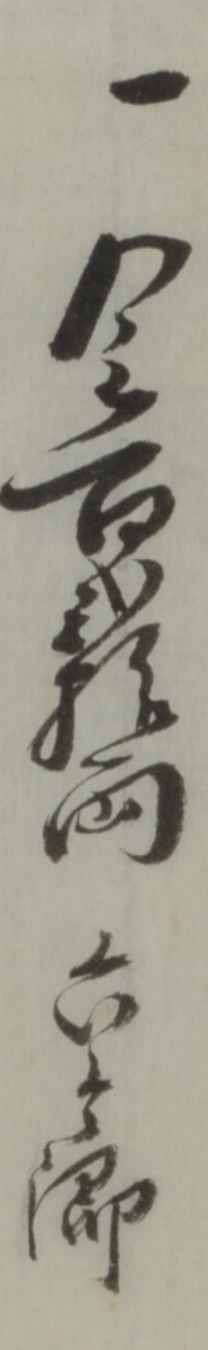一金百弐拾両六ヶ郷
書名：在町雑穀御買入大図
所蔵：伊那市立高遠町図書館・合同会社AMANE
